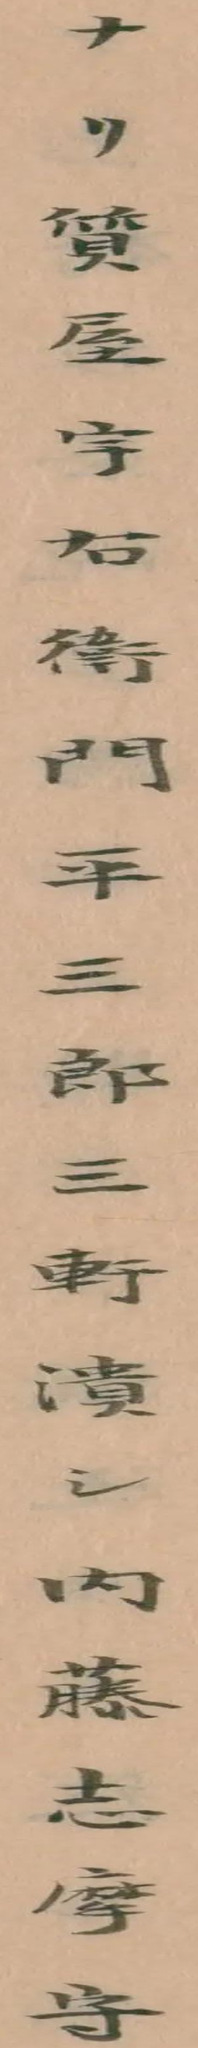ナリ質屋宇右衛門平三郎三軒潰シ内藤志摩守
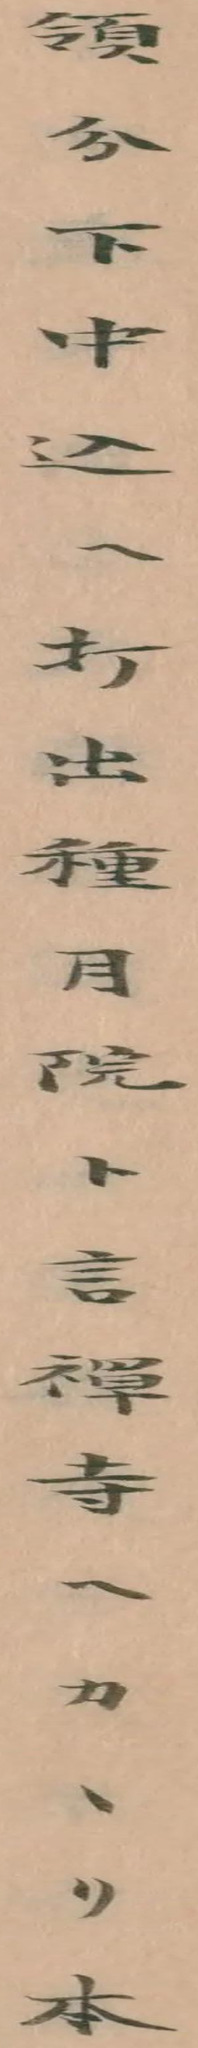領分下中編へ打出種月院ト言禅寺へカゝり本
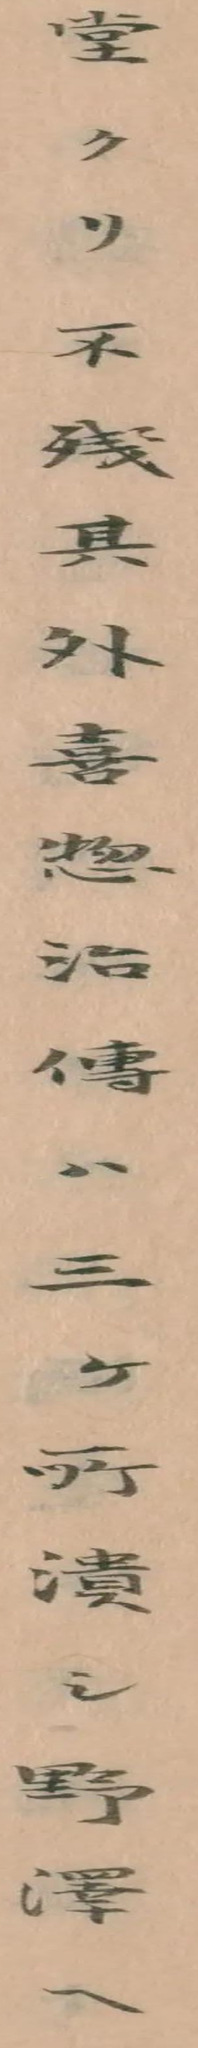堂クリ不残其外喜惣治伝八三ヶ所潰シ野沢へ
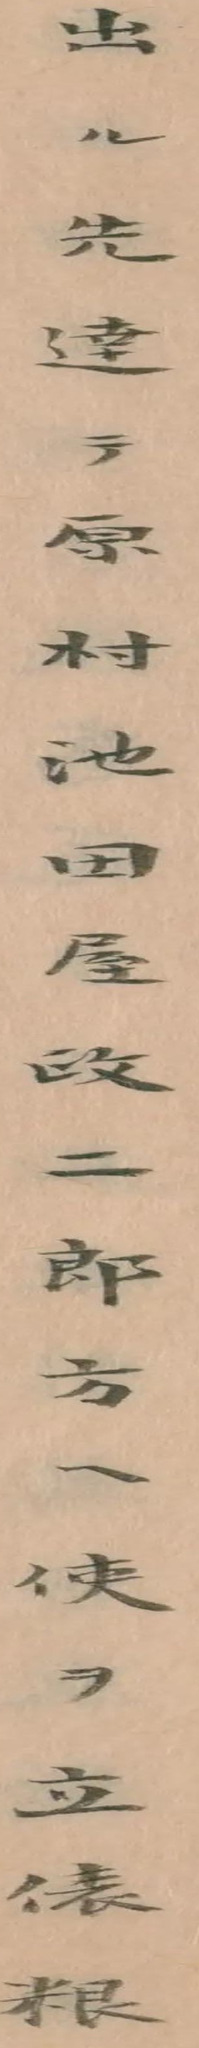出ル先達テ原村池田屋政二郎方へ使ヲ立俵粮
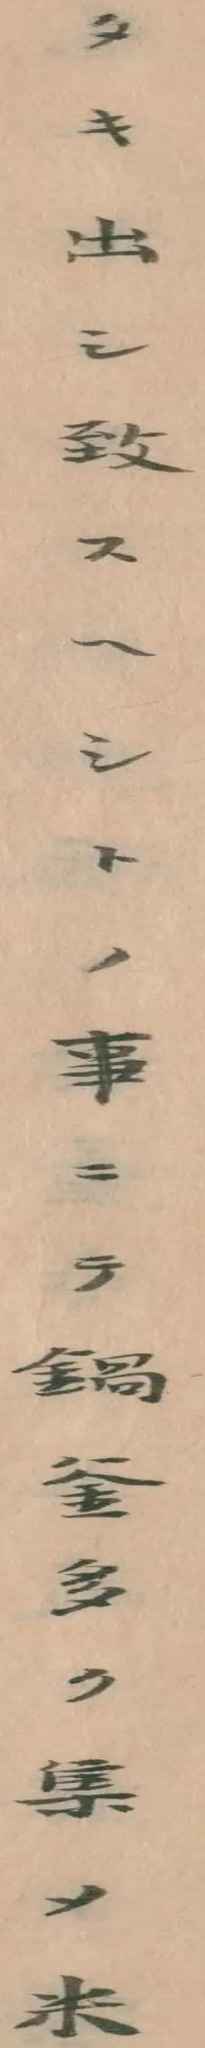タキ出シ致スヘシトノ事ニテ鍋釜多ク集メ米
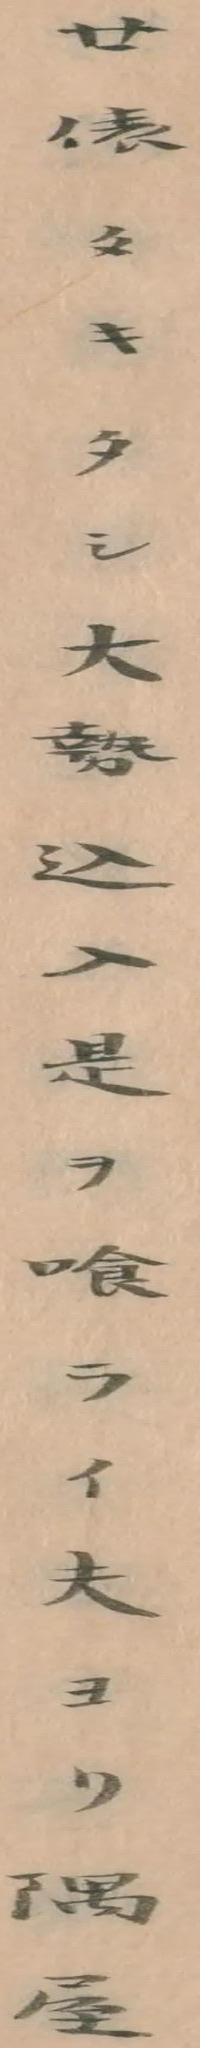廿俵タキタシ大勢込入是ヲ喰ライ夫ヨリ隅屋
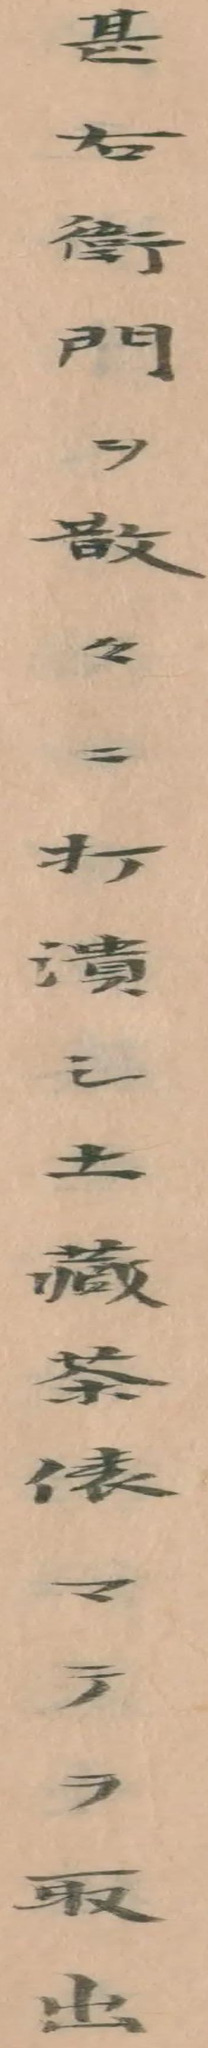甚右衛門ヲ散々二打潰シ土蔵茶俵マテヲ取出

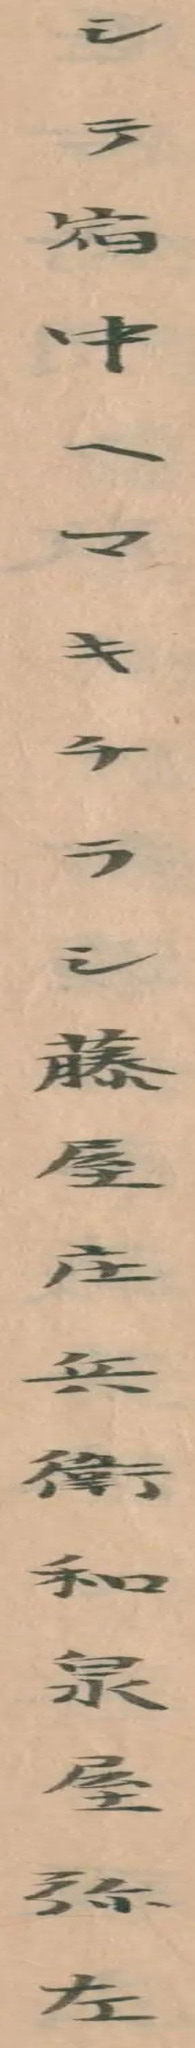シテ宿中へマキチラシ藤屋庄兵衛和泉屋弥左
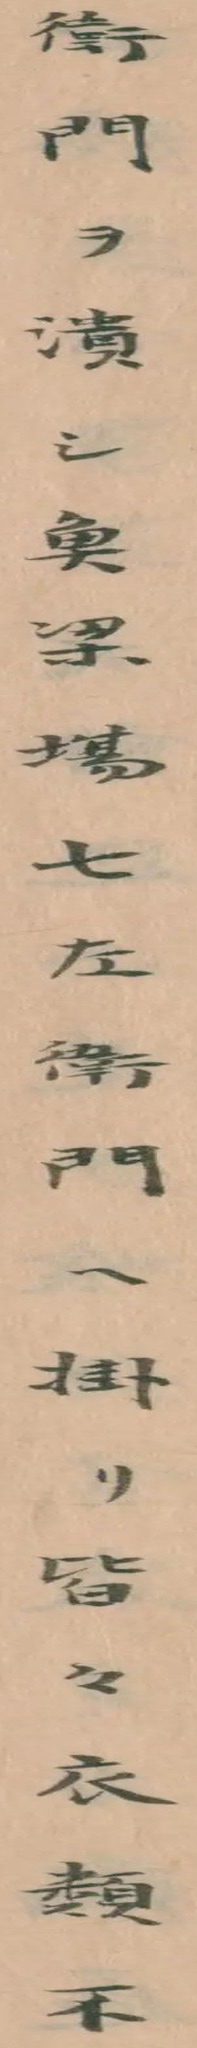衛門ヲ潰シ魚梁場七左衛門へ掛り皆々衣類不
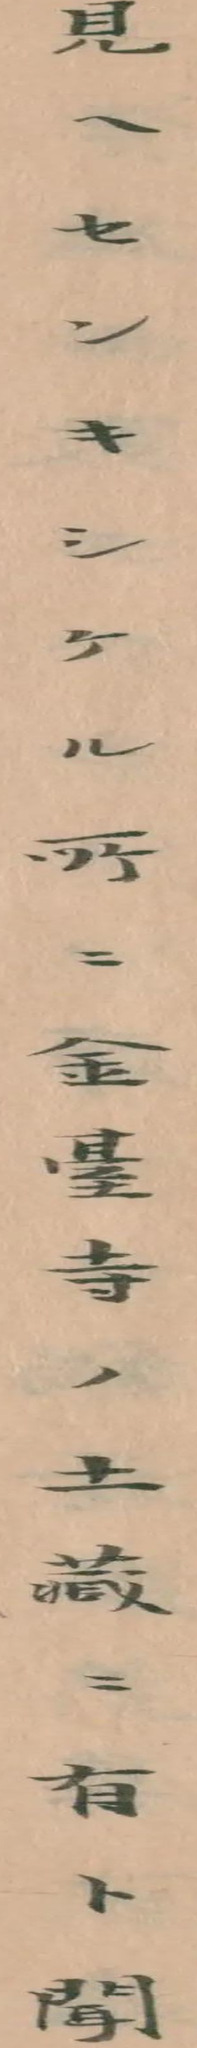見へセンキシケル所二金台寺ノ土蔵二有ト聞
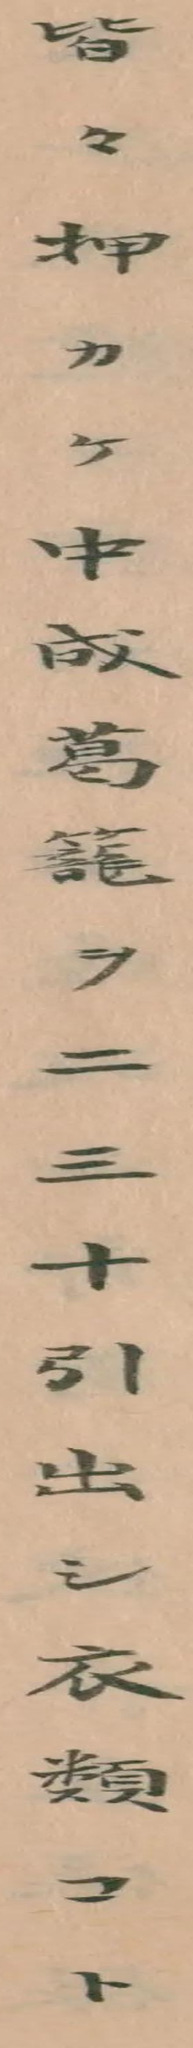皆々押カケ中成葛籠ヲ二三十引出シ衣類コト
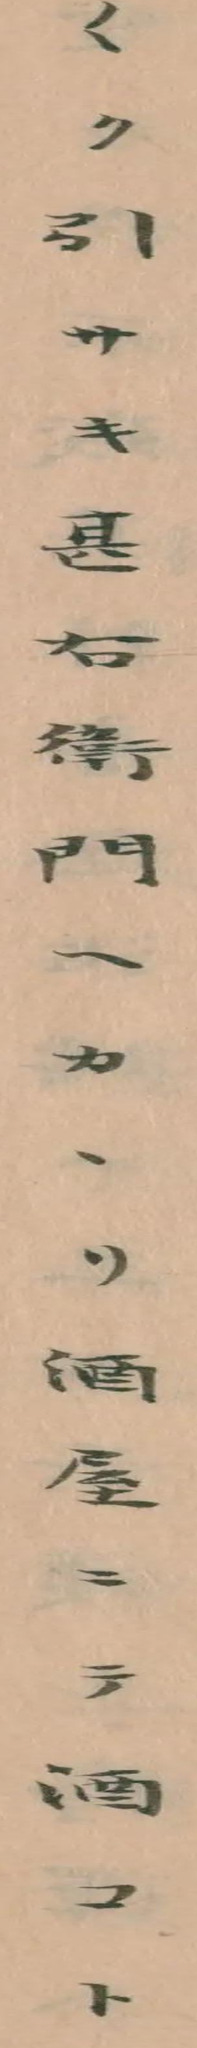〳〵ク引サキ甚右衛門へカゝリ酒屋ニテ酒コト
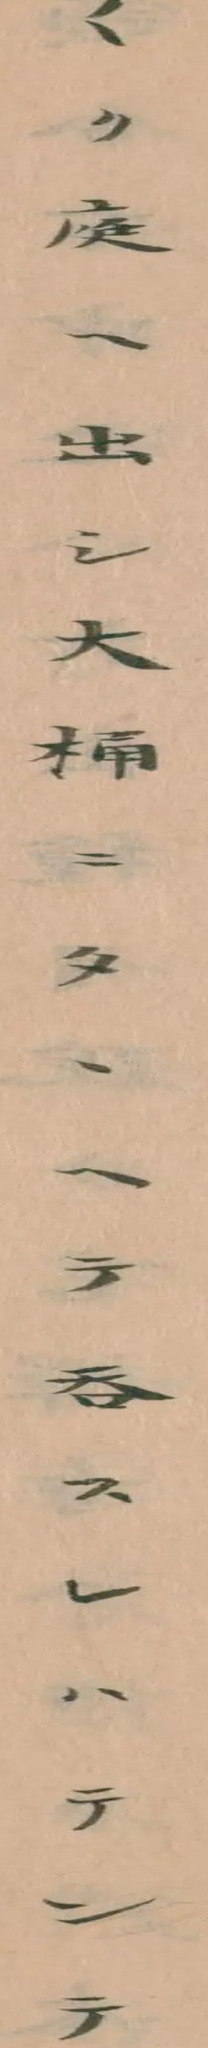〳〵ク庭へ出シ大桶二タゝヘテ呑スレハテンテ
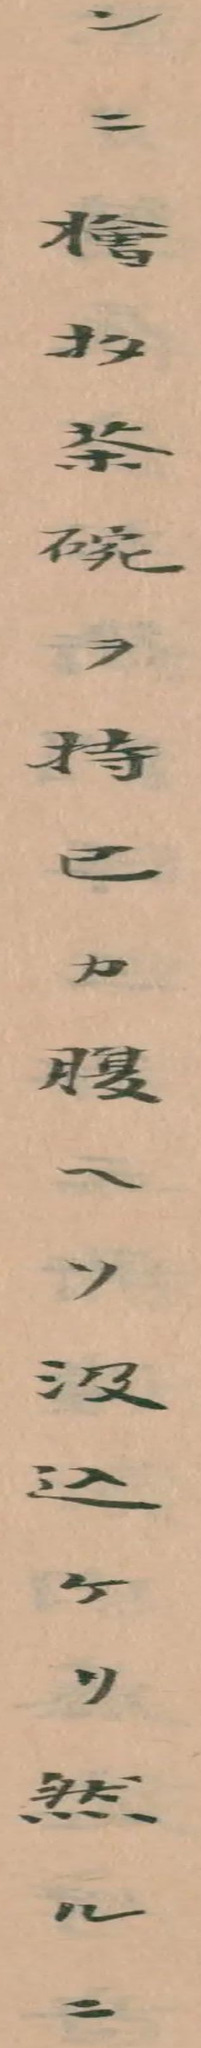ン二檜圴茶碗ヲ持己カ腹ヘソ汲込ケリ然ル二
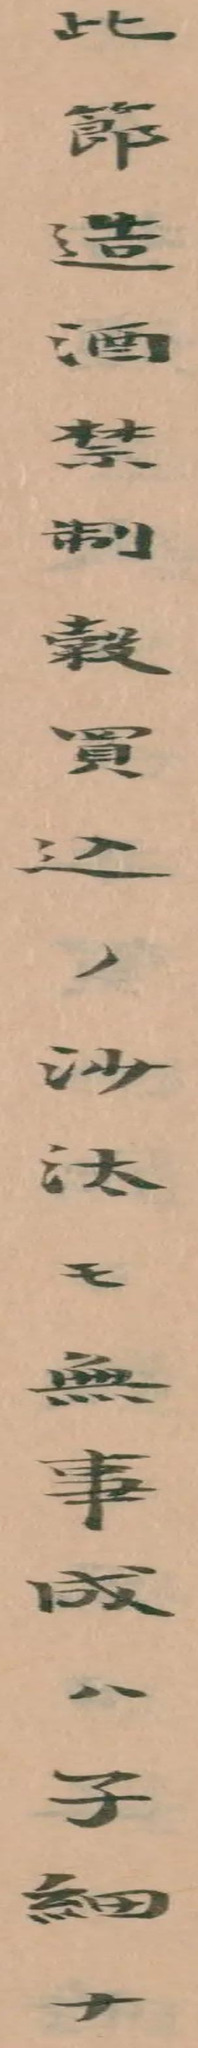此節酒造禁制穀買込ノ沙汰モ無事成ハ子細ナ
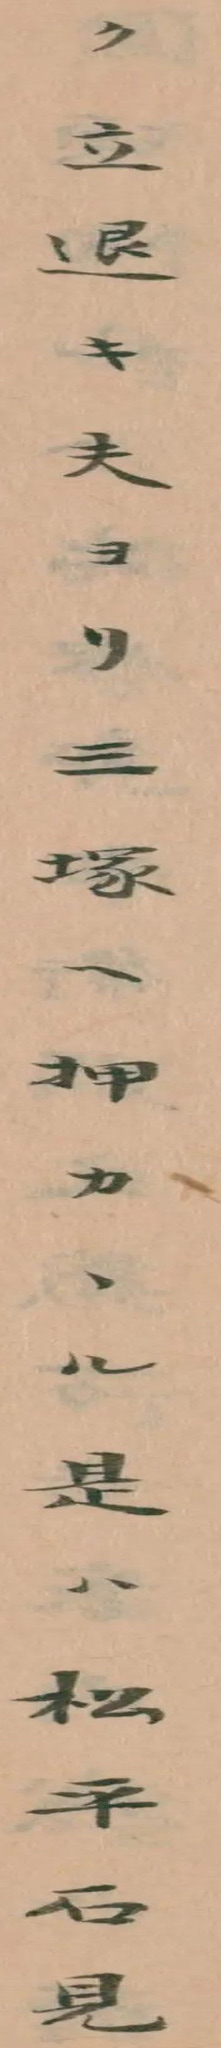ク立退キ夫ヨリ三塚へ押カゝル是ハ松平石見
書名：地災撮要. 巻3(地震之部)-巻4(噴火之部)
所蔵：国立国会図書館 National Diet Library, JAPAN
